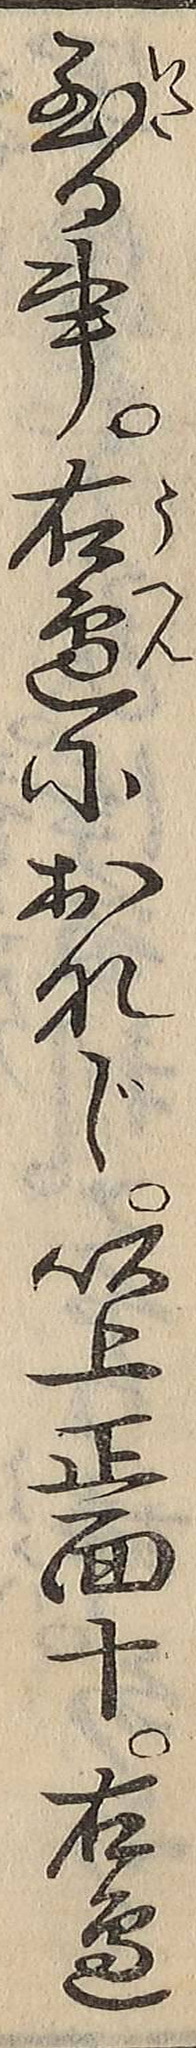至る事。右辺におなじ。以上正面十。右辺
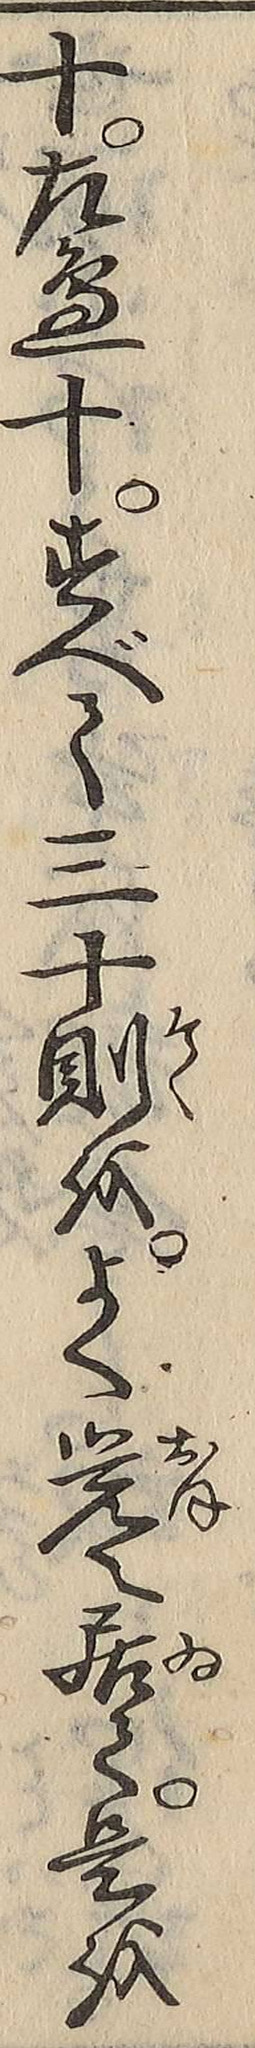十。左辺十。すべて三十則を。よく覚え居て。是を
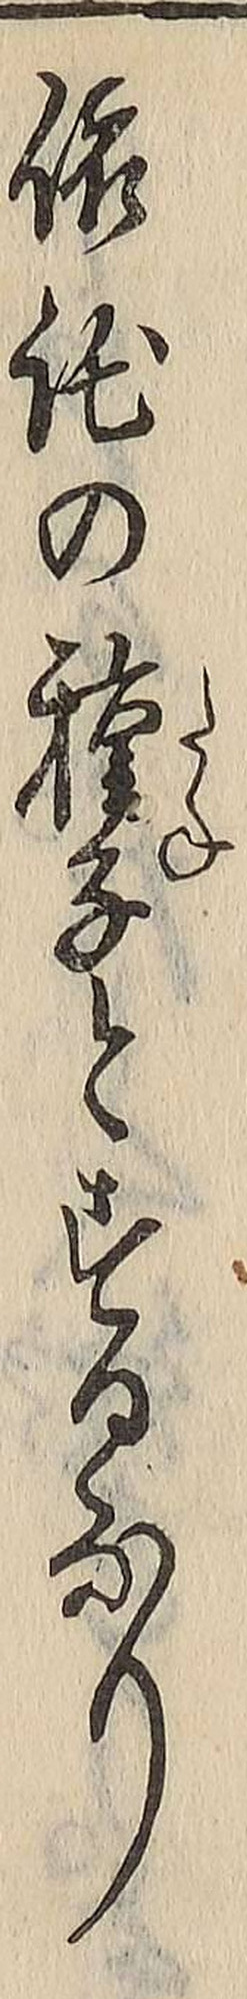依託の種子とするなり
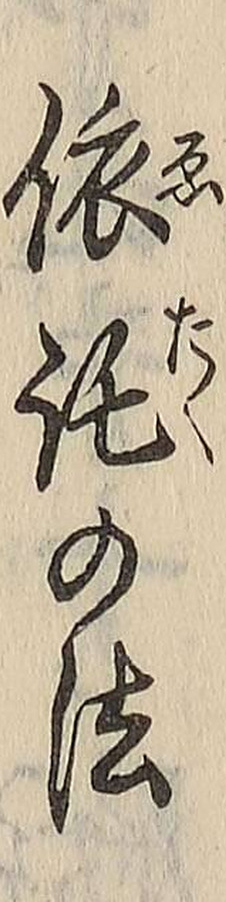依託の法
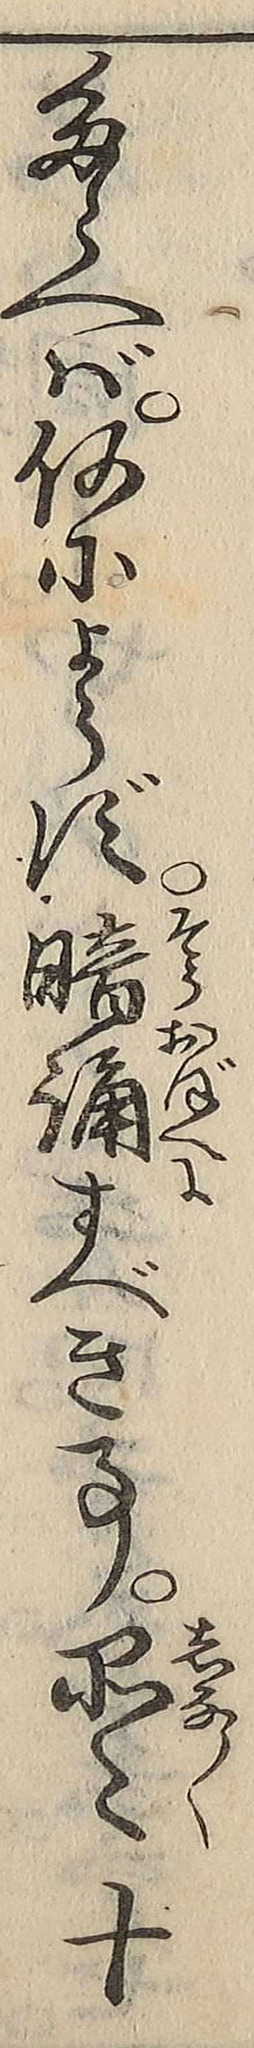たとへば。何によらず。暗誦すべき事。品々十
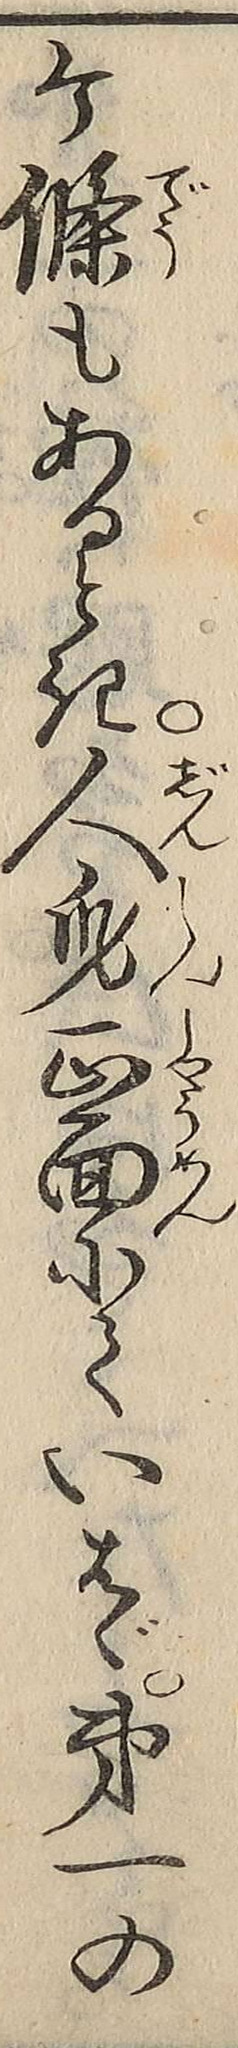ヶ條もあるとき。人身正面にていはゞ。第一の
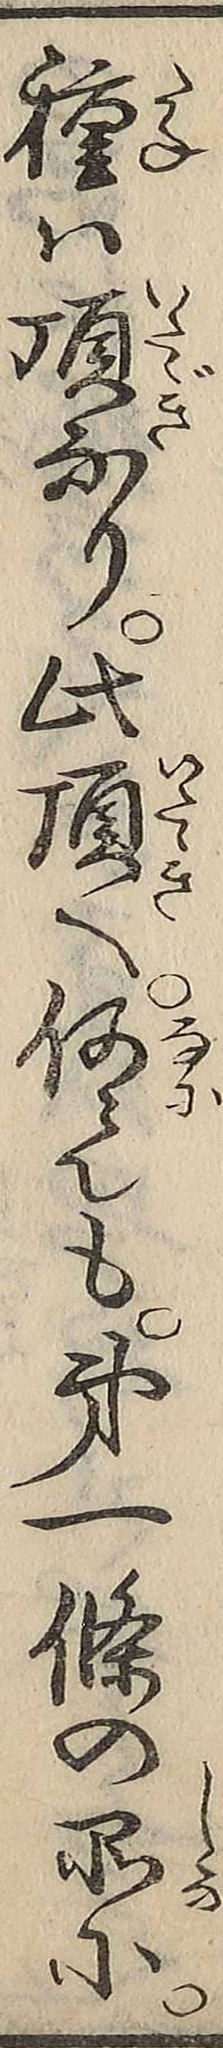種は頂なり。此頂へ。何にても。第一條の品に。
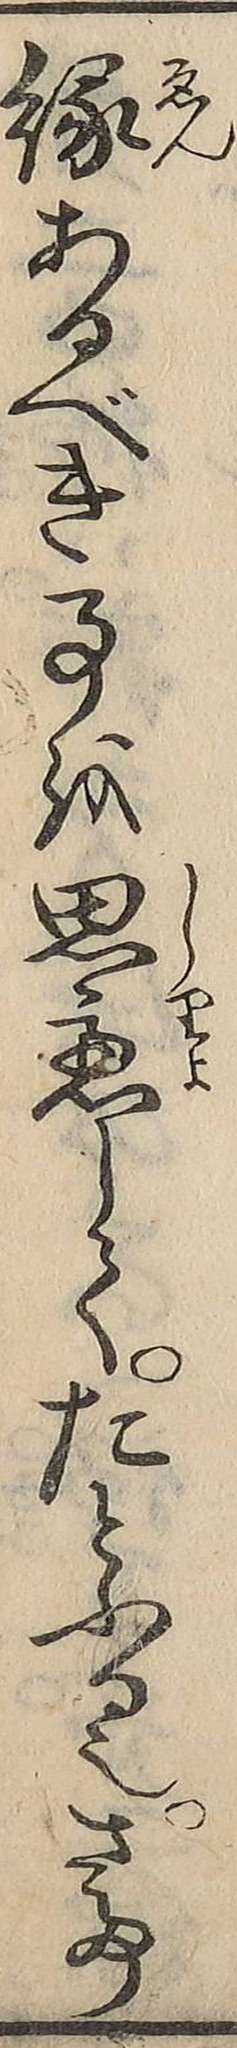縁あるべき事を思慮して。たとふる也。さて

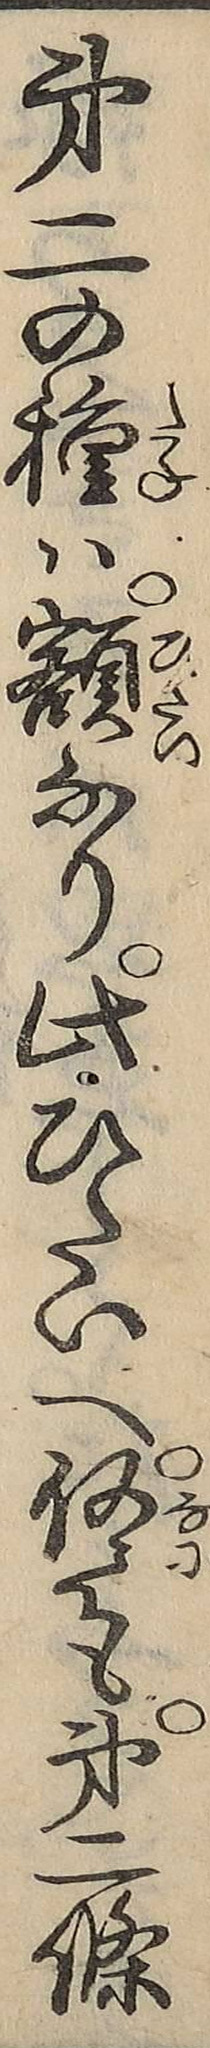第二の種は。額なり。此ひたいへ。何にても。第二條
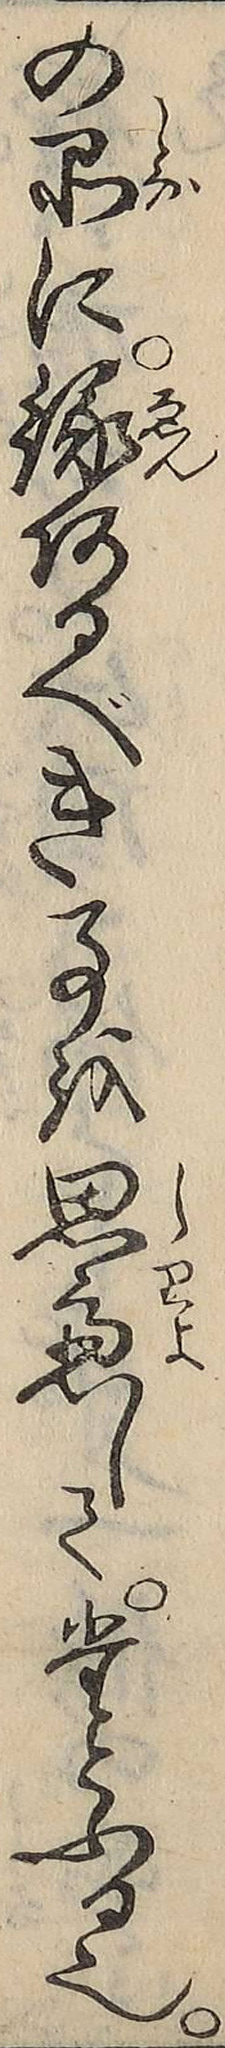の品に。縁あるべき事を思慮して。たとふる也。
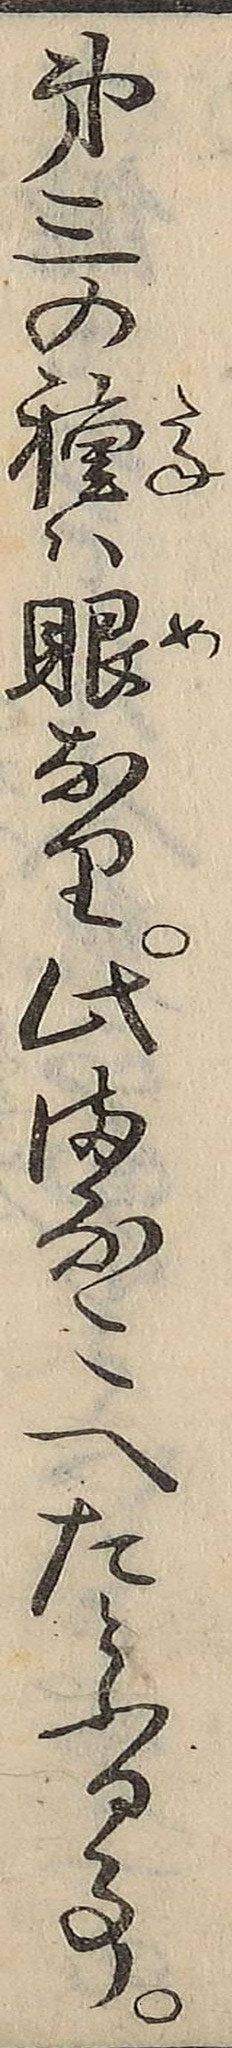第三の種は眼なり。此まなこへたとふる事。
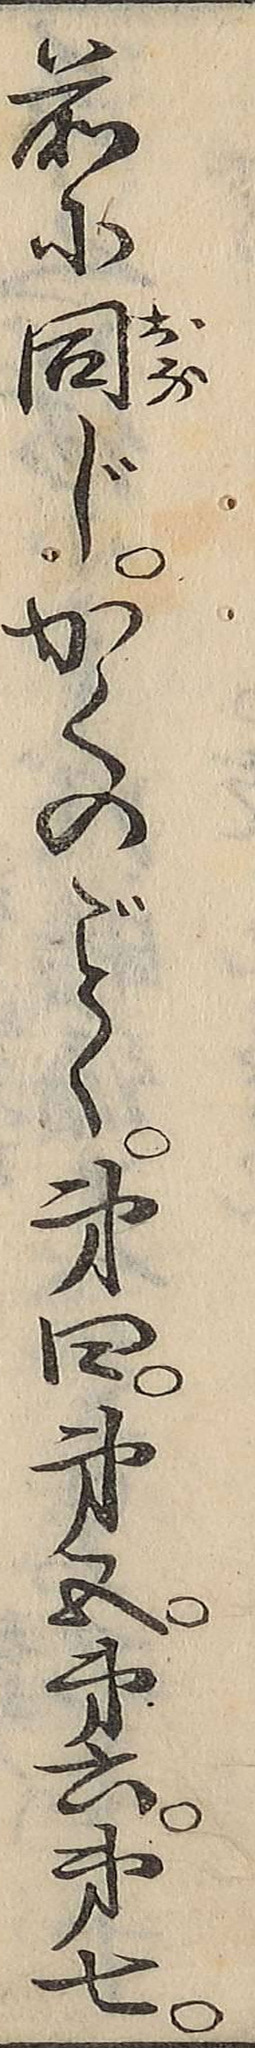前に同じ。かくのごとく。第四。第五。第六。第七。
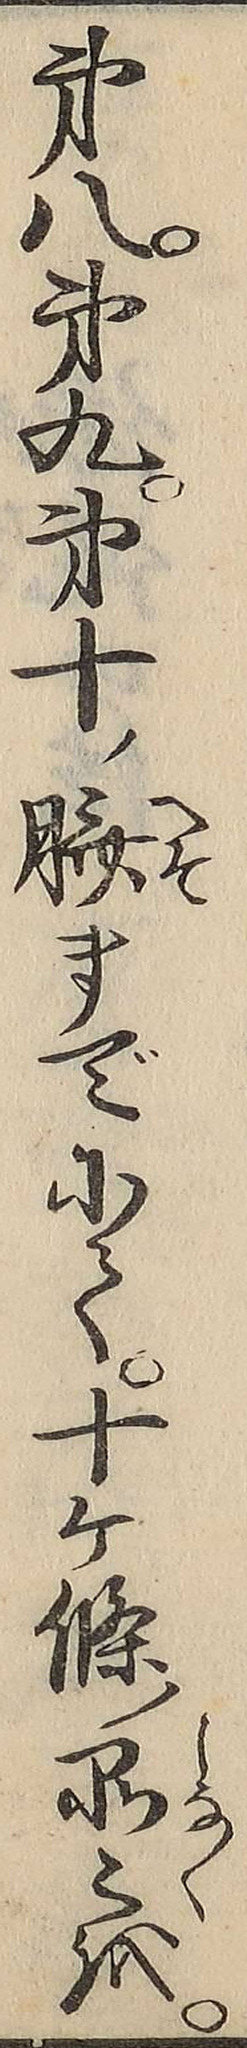第八。第九。第十の臍までにて。十ヶ條の品々を。
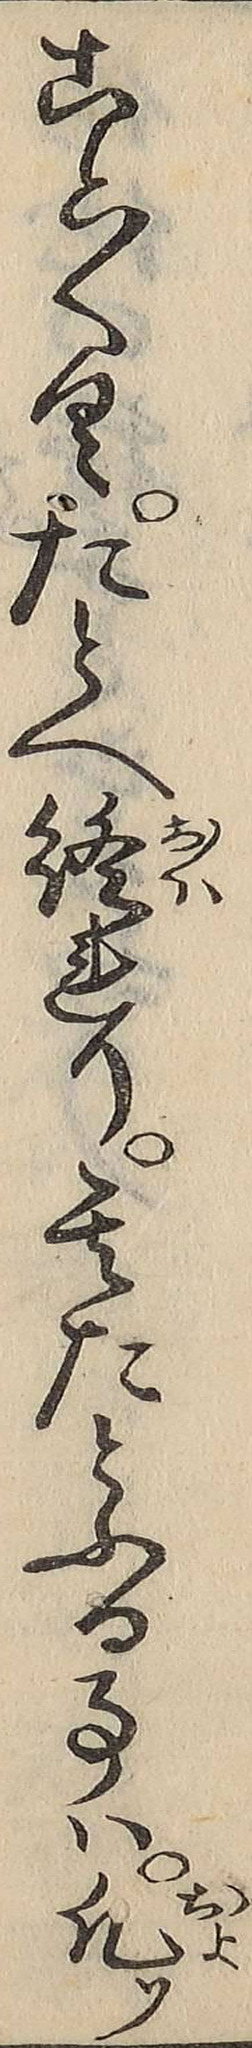こと〳〵く。たとへ終れり。其たとふる事は。凡そ
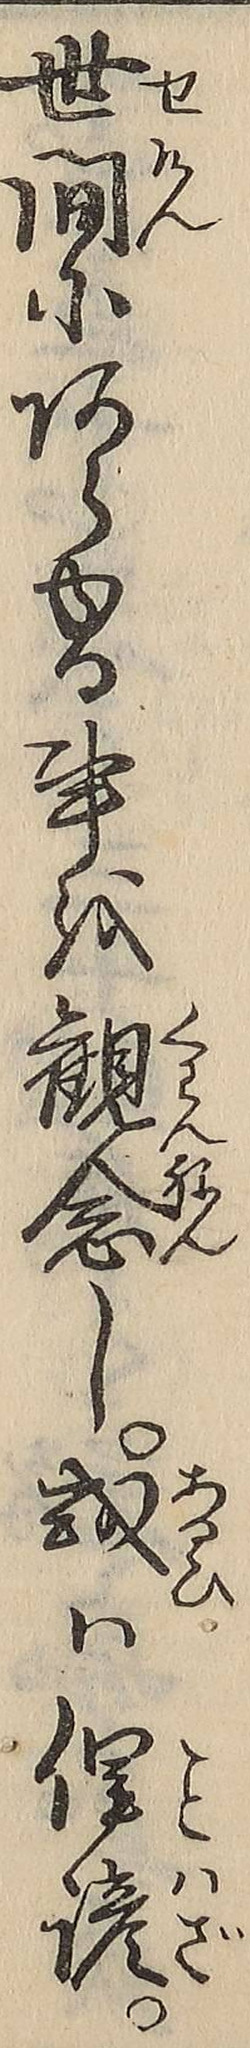世間にあらゆる事を観念し。或は俚諺。
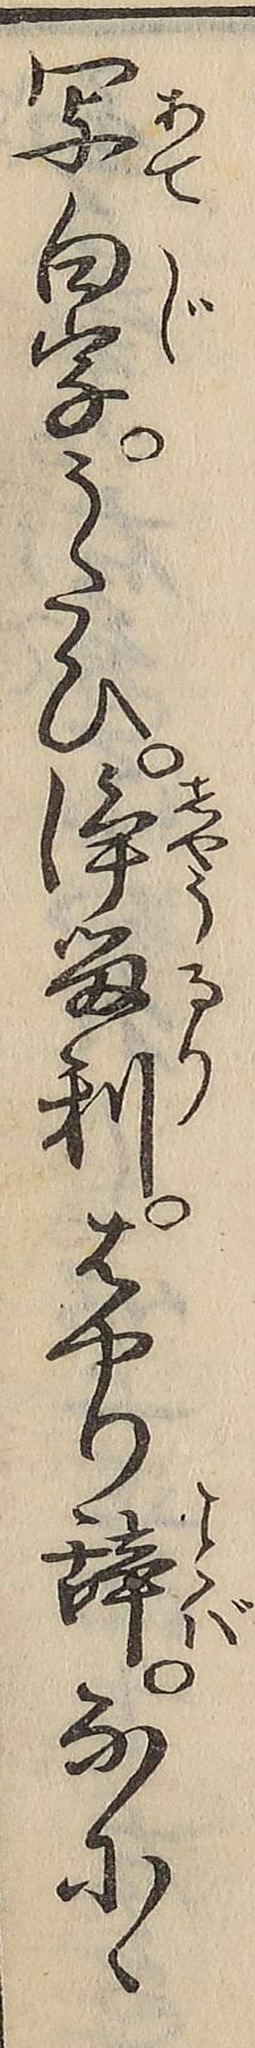写白字。うたひ。浄留利。はやり辞。なにゝ
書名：物覺秘傳
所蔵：神戸大学附属図書館 国文学研究資料館
